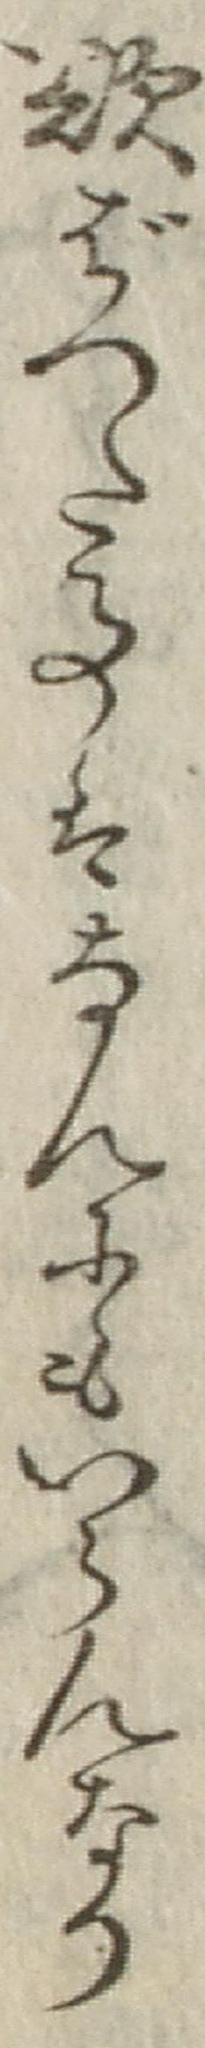欲ばつた事はなんにもいらんなり
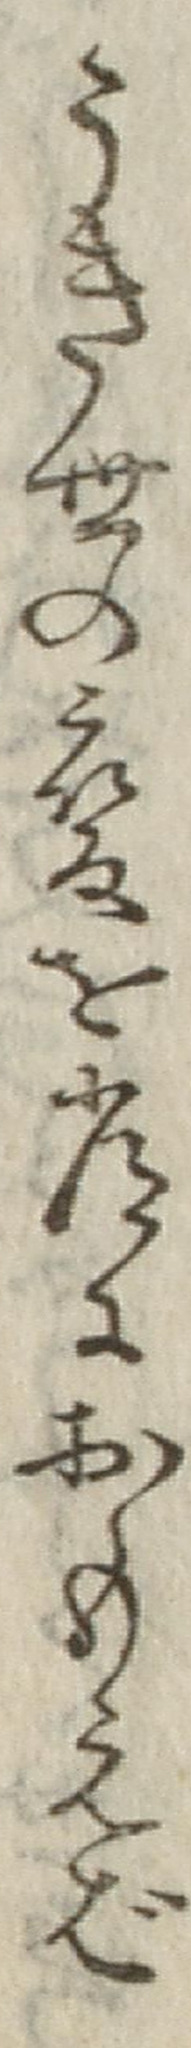うき世の変を常におもへば
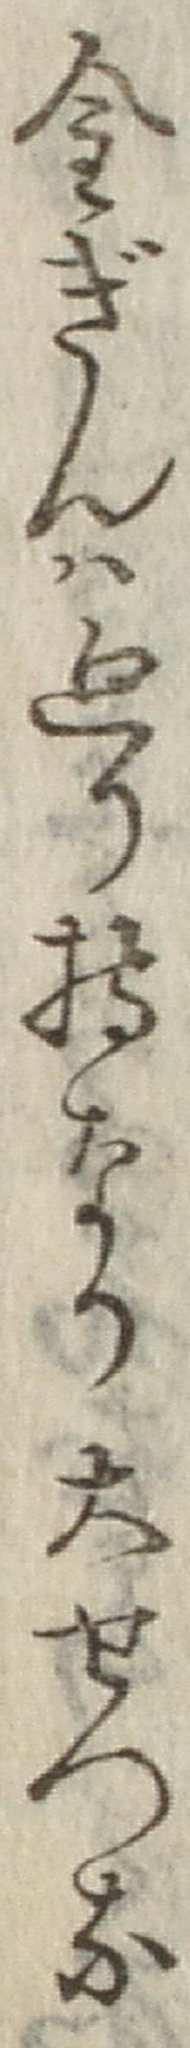金ぎんは廻り持なり大せつな
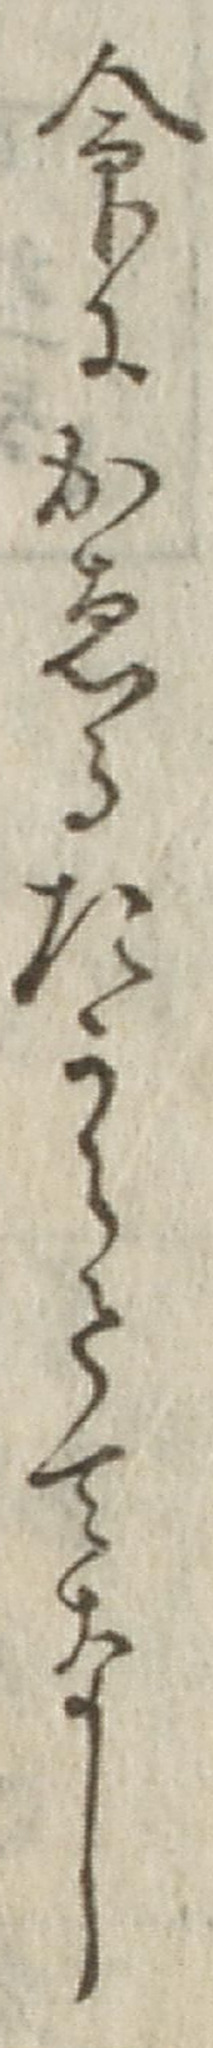命にかゑるたからとてなし
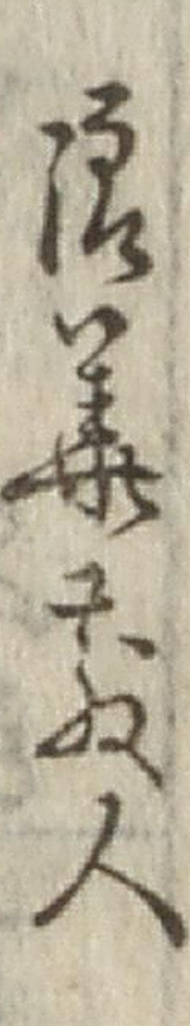浪華散人
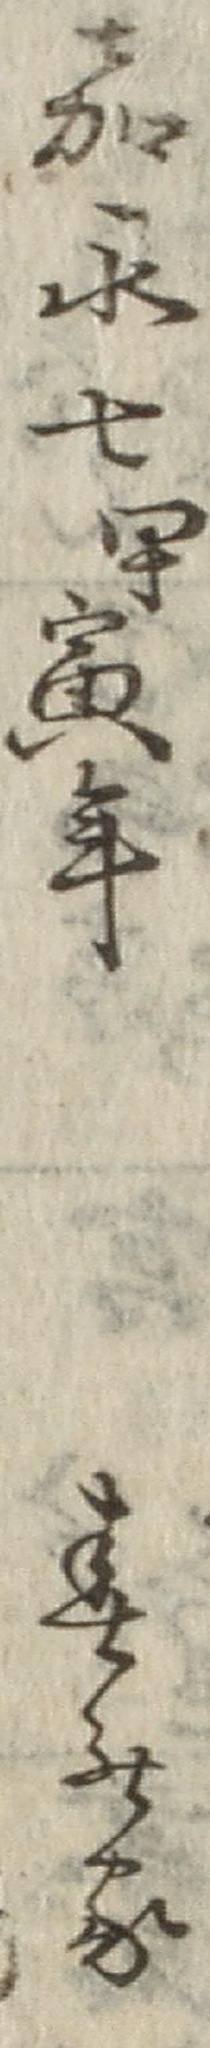嘉永七甲寅年春の家
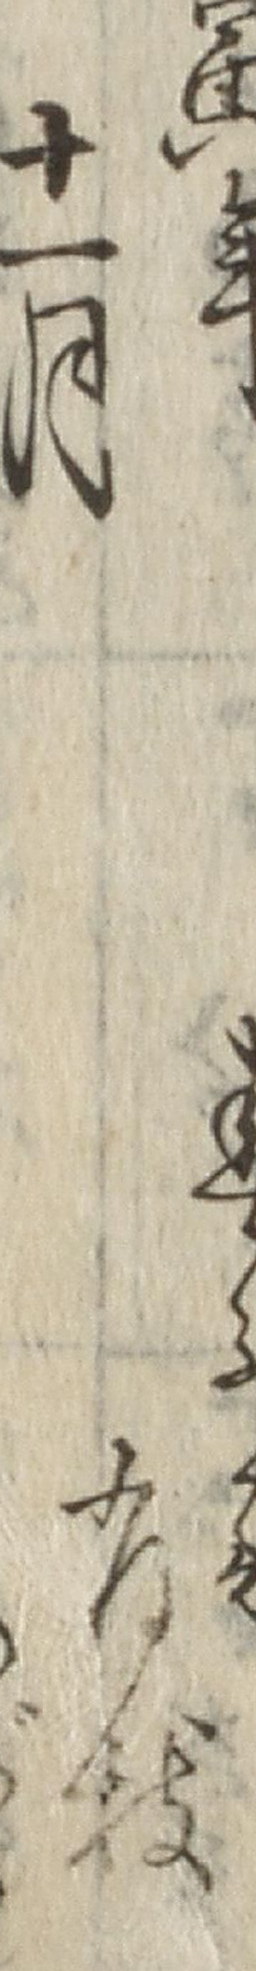十一月有枝
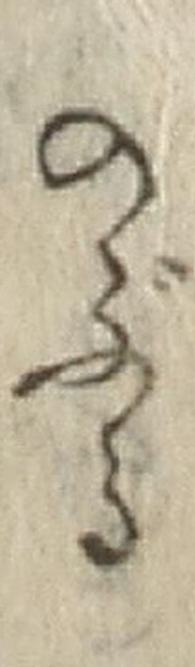のぶる
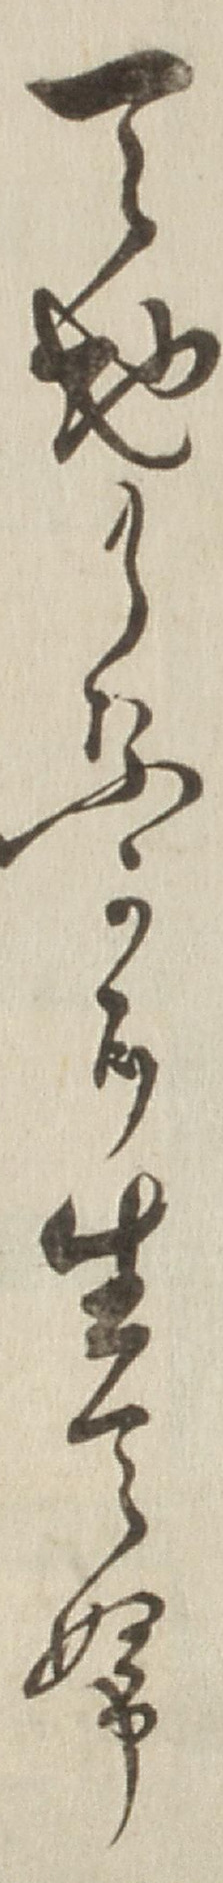天地のなかに生てふ
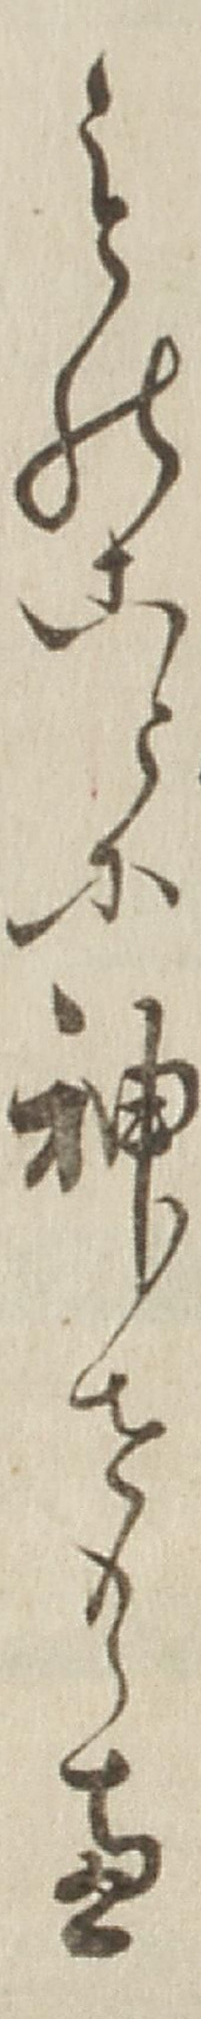ものことに神世の恵
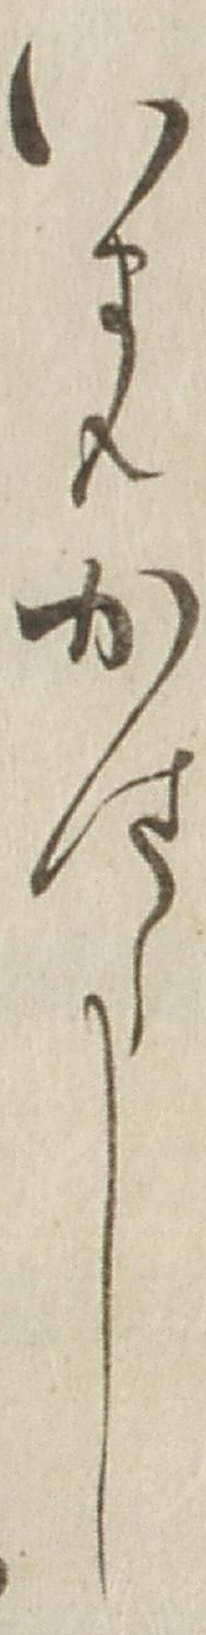いまもかはらし
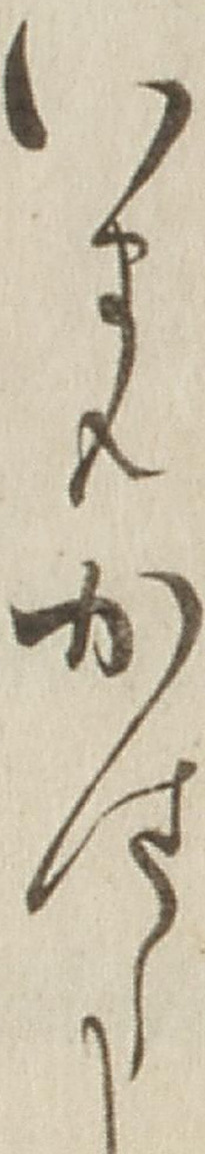いまもかはらし
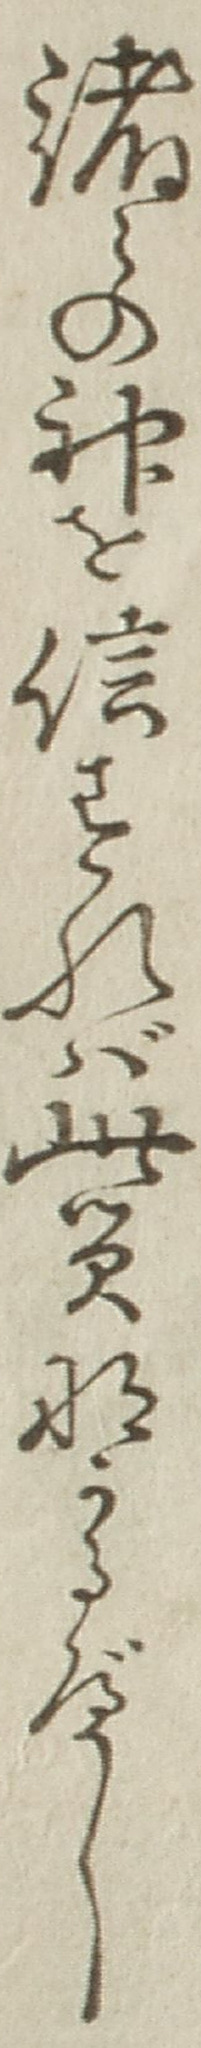諸々の神を信すれば此災なかるべし
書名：世直り艸紙
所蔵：東京大学地震研究所図書室 Earthquake Research Institute Library, The University of Tokyo, JAPAN
